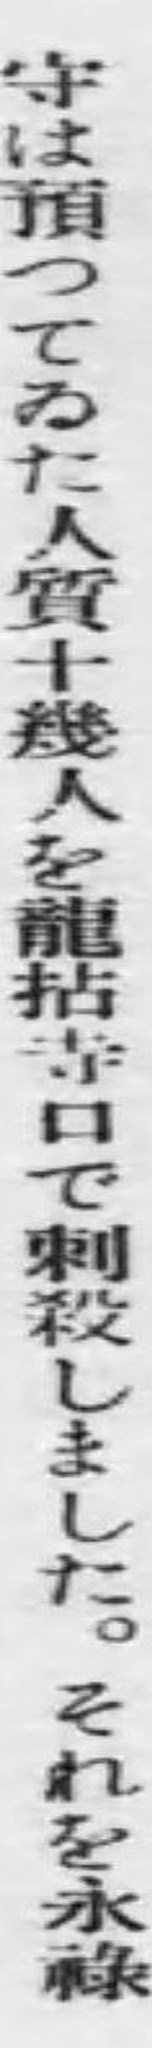守は預つてゐた人質十幾人を龍拈寺口で刺殺しました。それを永禄
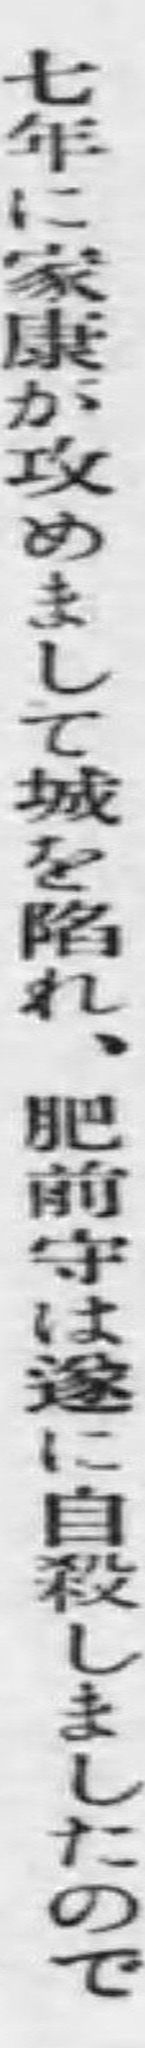七年に家康が攻めまして城を陥れ、肥前守は遂に自殺しましたので
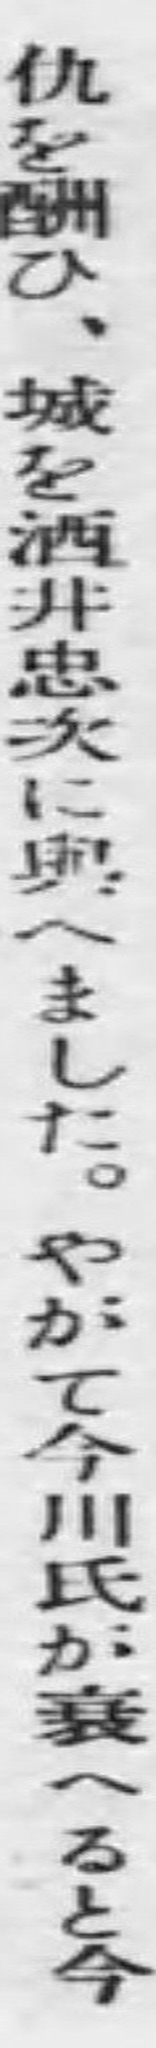仇を酬ひ、城を酒井忠次に与へました。やがて今川氏が衰へると今
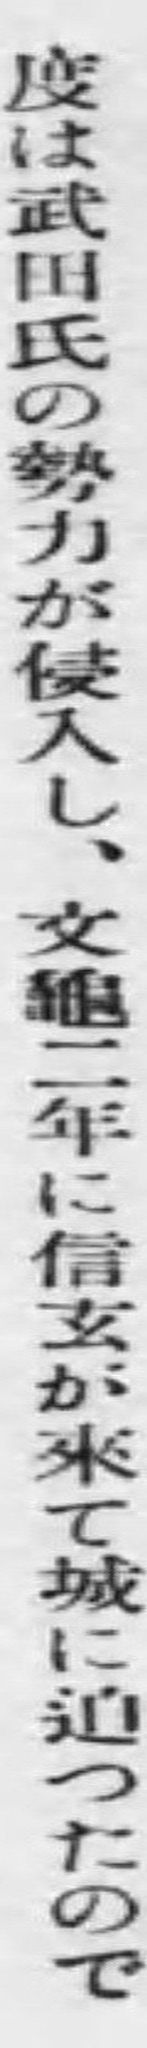度は武田氏の勢力が侵入し、文亀二年に信玄が来て城に迫つたので
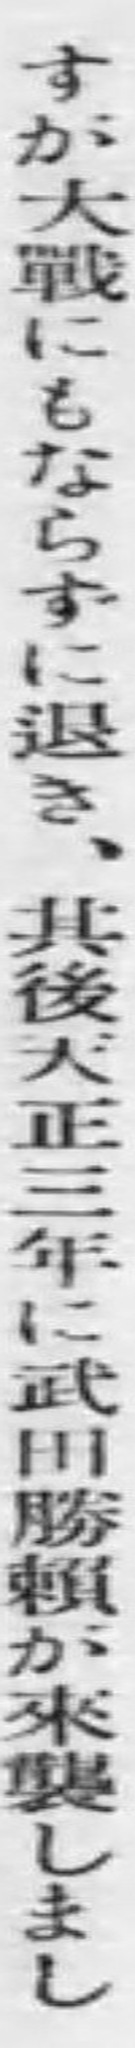すが大戦にもならずに退き、其後天正三年に武田勝頼が来襲しまし
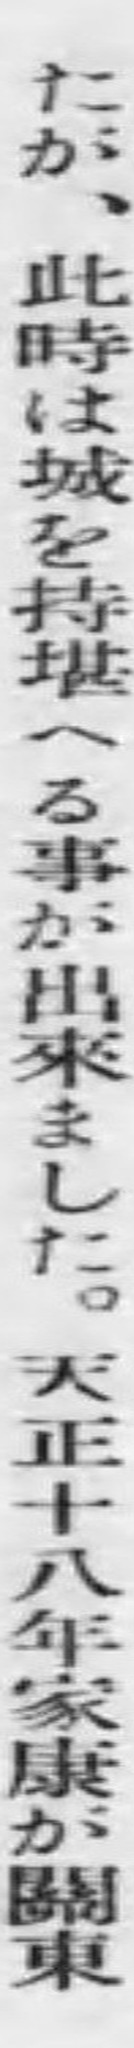たが、此時は城を持堪へる事が出来ました。天正十八年家康が関東
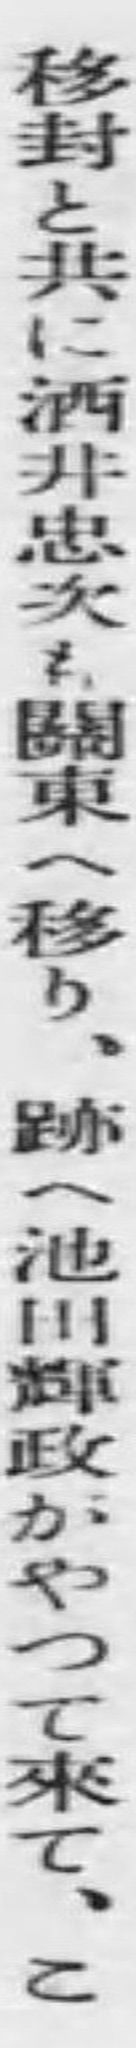移封と共に酒井忠次も関東へ移り、跡へ池田輝政がやつて来て、こ
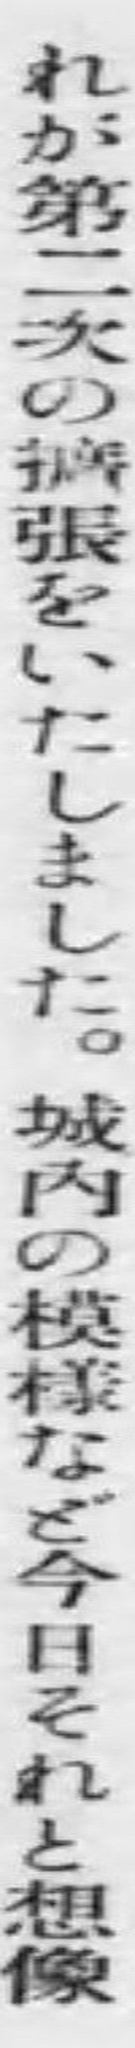れが第二次の拡張をいたしました。城内の模様など今日それと想像
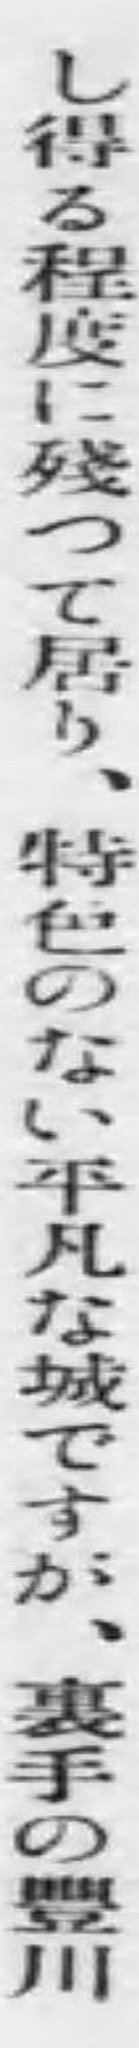し得る程度に残つて居り、特色のない平凡な城ですが、裏手の豊川
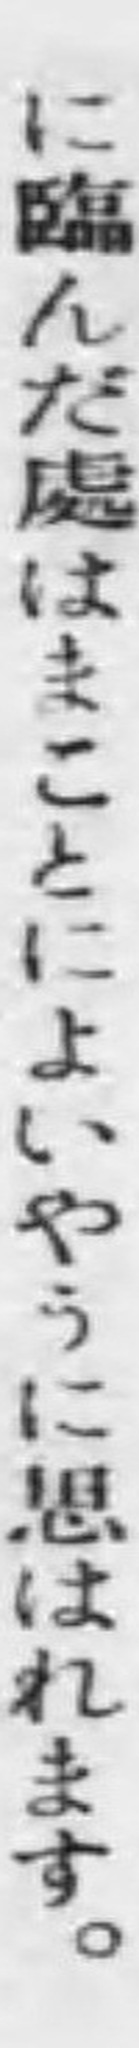に臨んだ処はまことによいやうに思はれます。
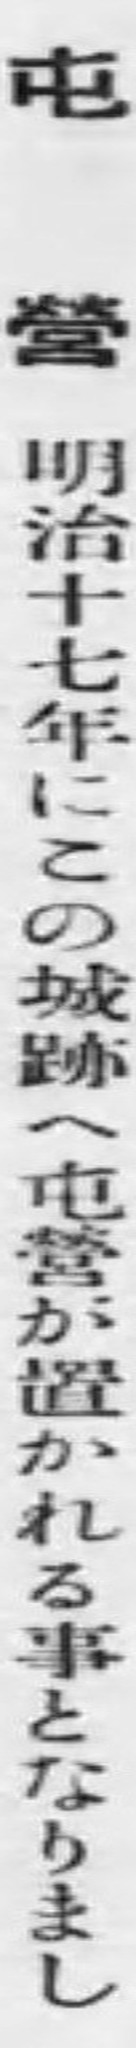屯営明治十七年にこの城跡へ屯営が置かれる事となりまし
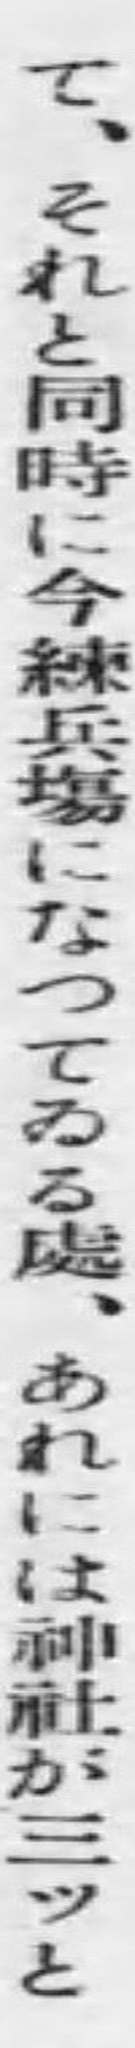て、それと同時に今練兵場になつてゐる処、あれには神社が三ッと
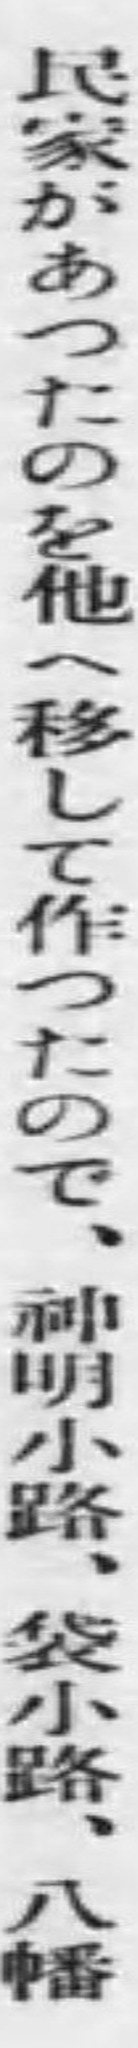民家があつたのを他へ移して作つたので、神明小路、袋小路、八幡
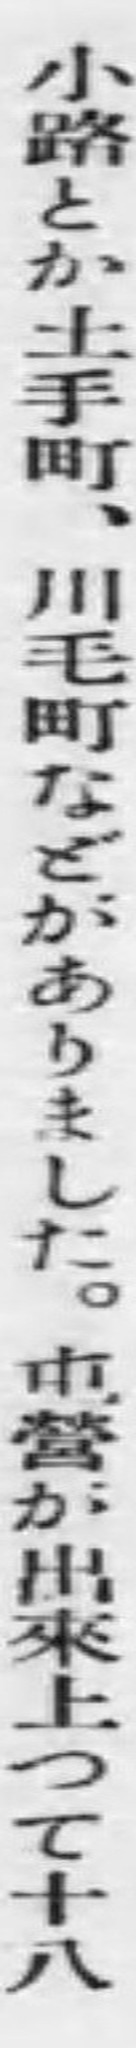小路とか土手町、川毛町などがありました。屯営が出来上つて十八
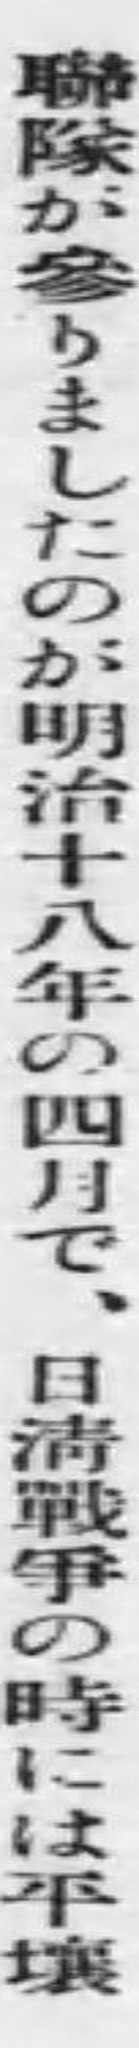聯隊が参りましたのが明治十八年の四月で、日清戦争の時には平壌
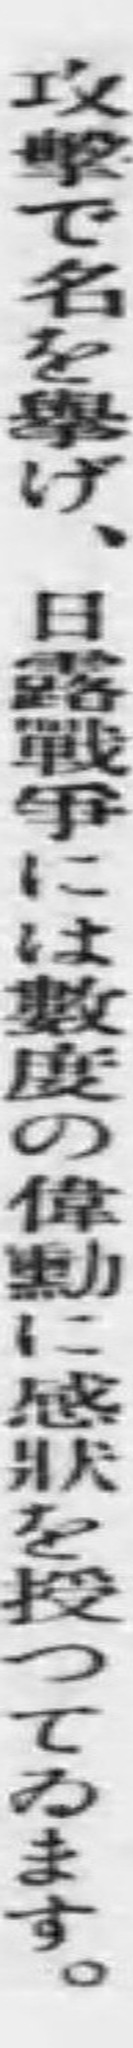攻撃で名を挙げ、日露戦争には数度の偉勲に感状を授つてゐます。
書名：東三河道中記 : 豊橋市及其附近案内
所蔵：国立国会図書館 National Diet Library, JAPAN
